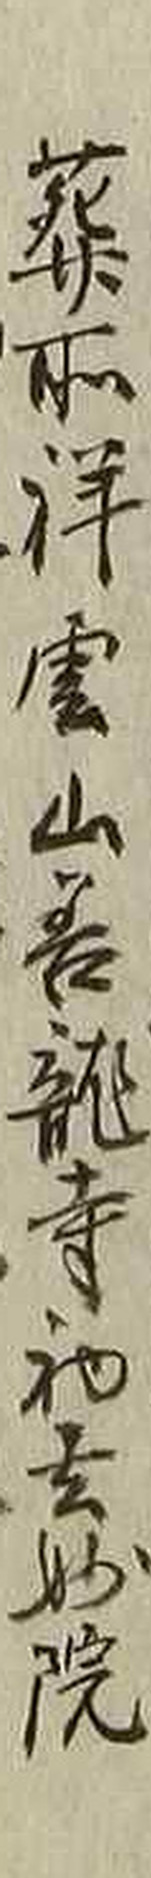葬所祥雲山善龍寺初玄妙院
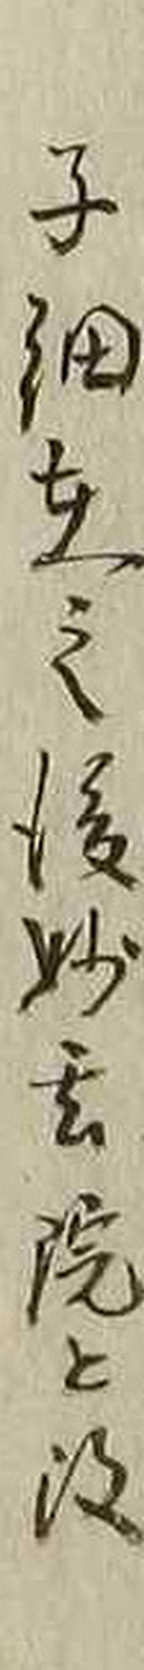子細在之後妙玄院と改
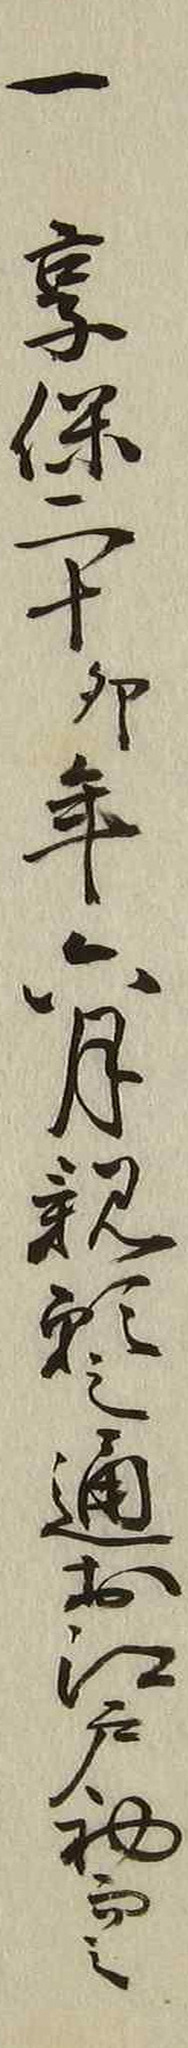一享保二十卯年六月親願之通於江戸初而之
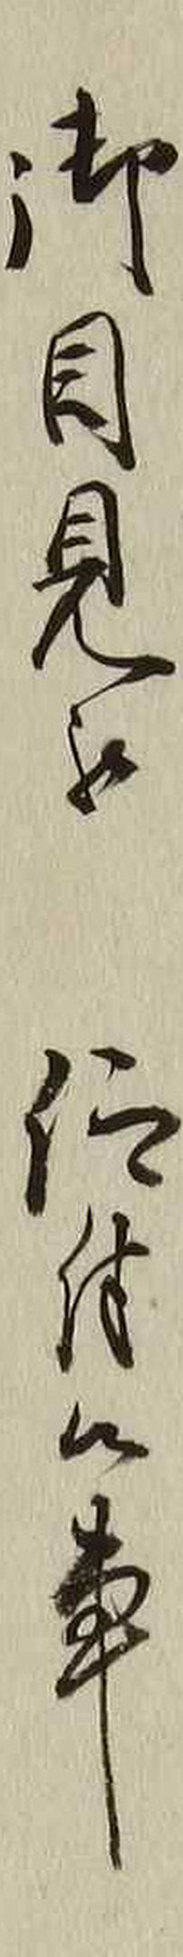御目見被仰付候事
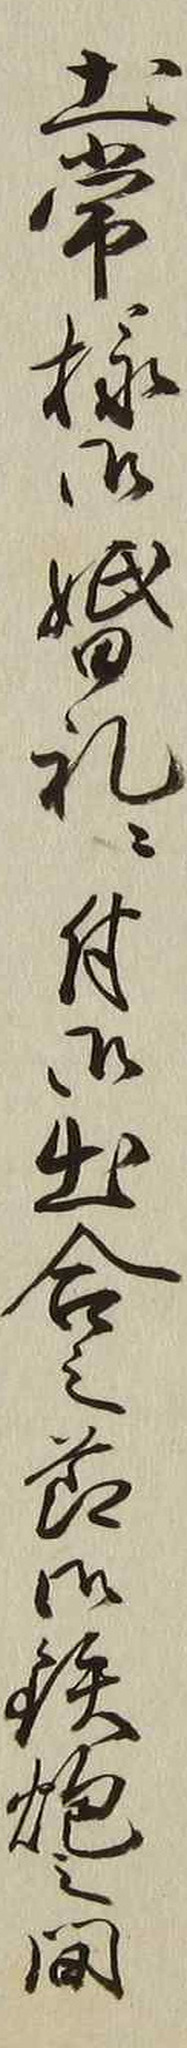土常様御婚礼ニ付御出合之節御鉄炮之間
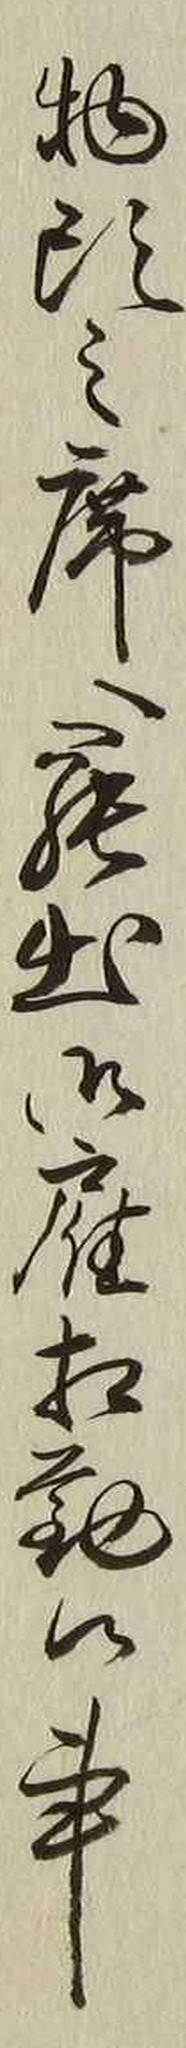物頭之席へ罷出御雇相勤候事
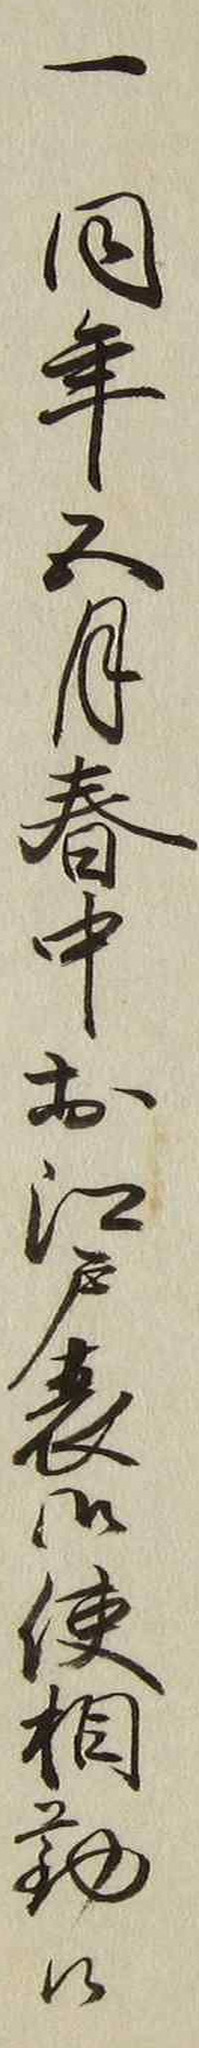一同年五月春中於江戸表御使相勤候
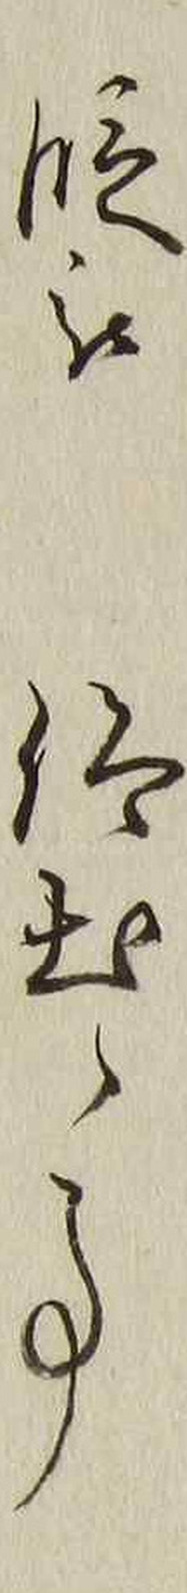段被仰出候事
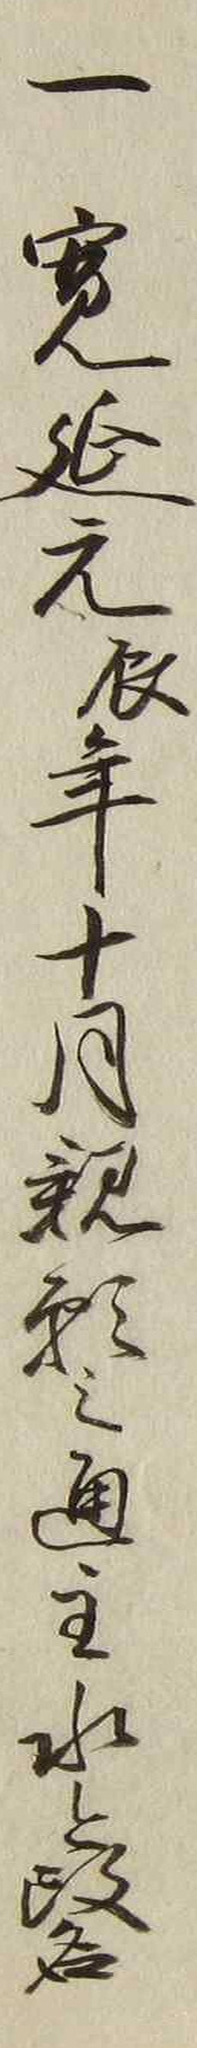一寛延元辰年十月親願之通主水と改名
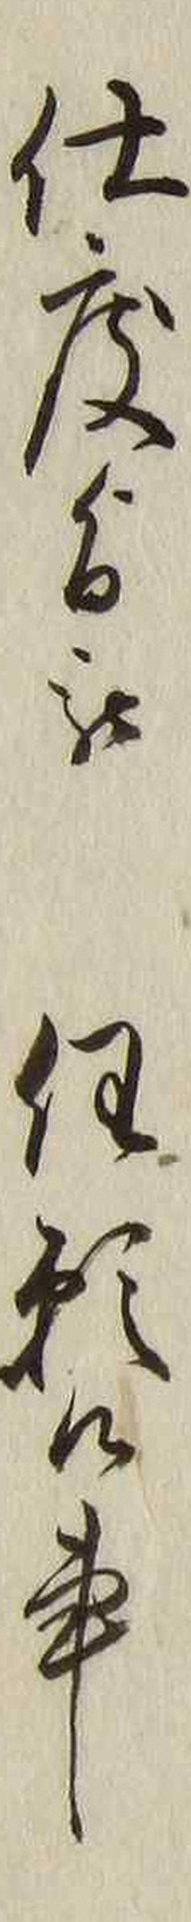仕度旨被任願候事
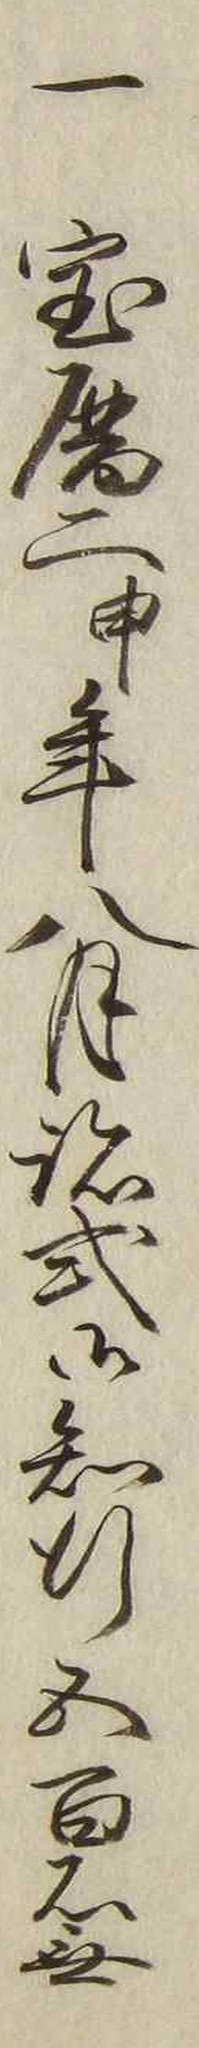一宝暦二申年八月跡式御知行五百石無

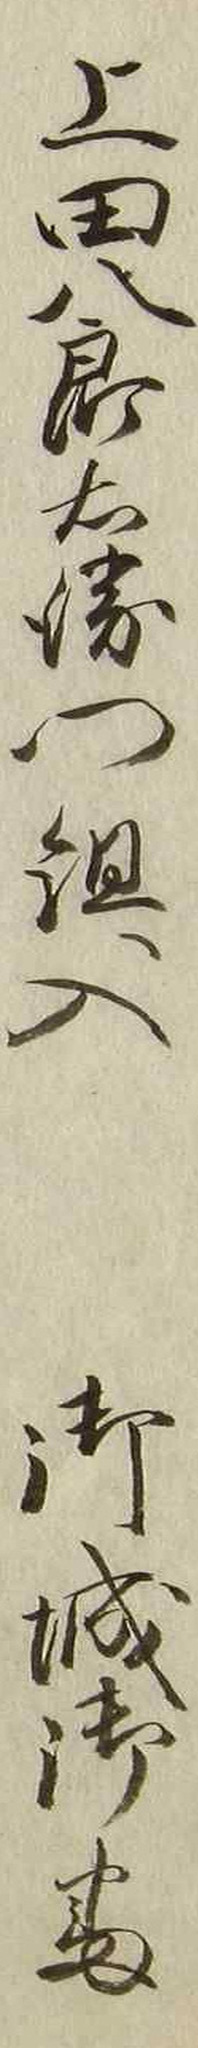上田八郎右衛門組へ入御城御番
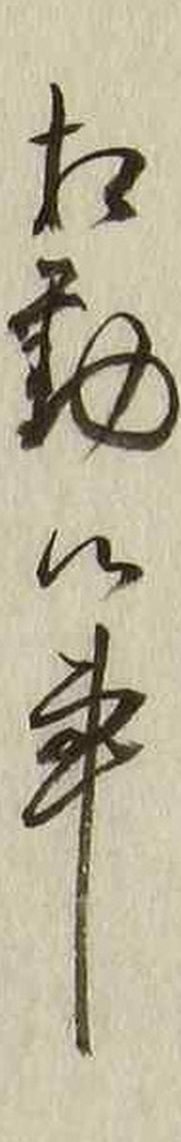相勤侯事
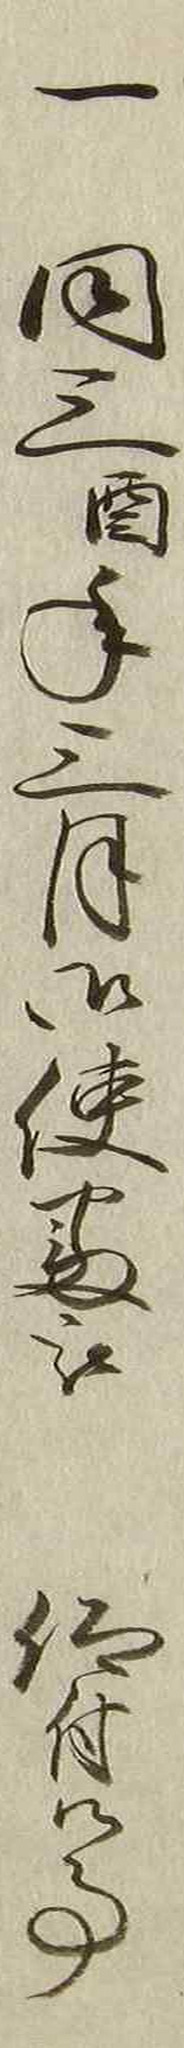一同三酉年三月御使番被仰付候事
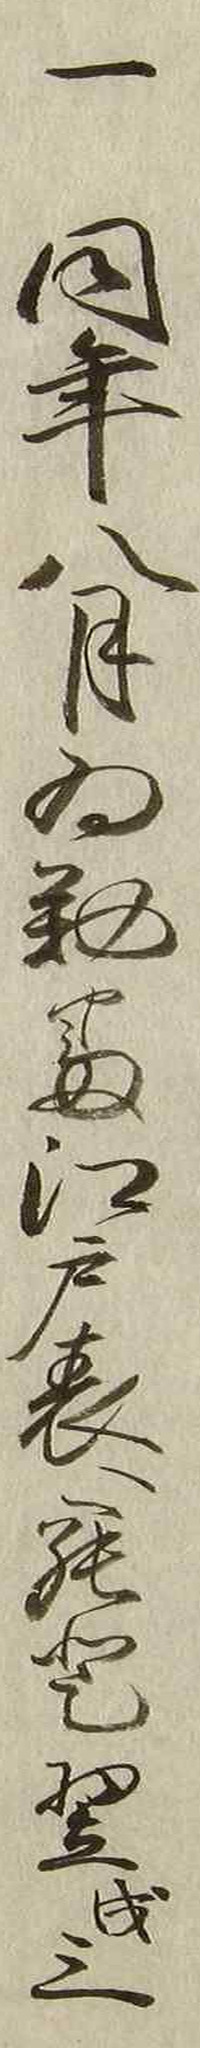一同年八月為勤番江戸表へ罷登翌戌三
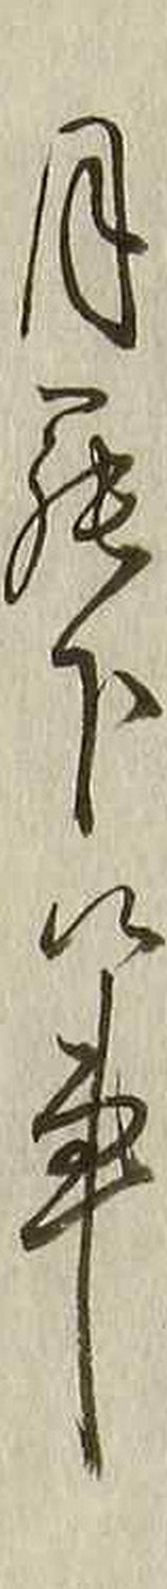月罷下候事
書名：諸士系譜　巻之21　い之部21
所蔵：会津若松市立会津図書館
